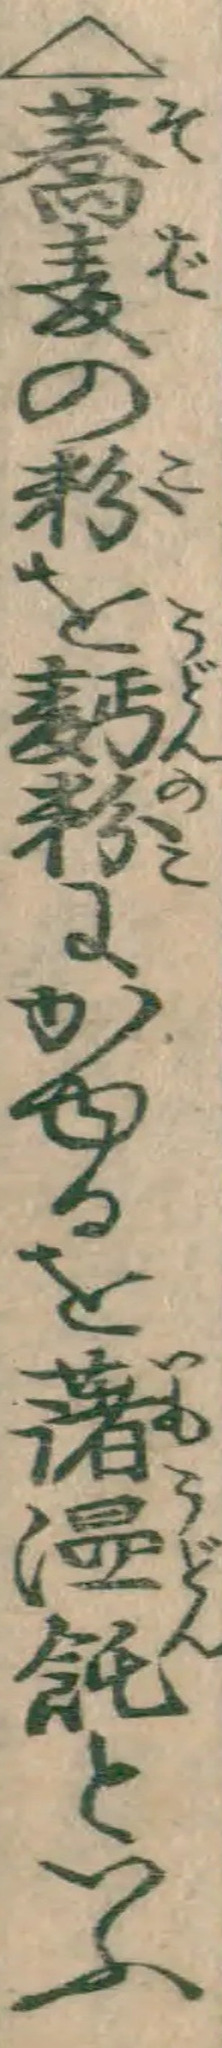△蕎麦の粉を麪粉にかゆるを藷温飩といふ

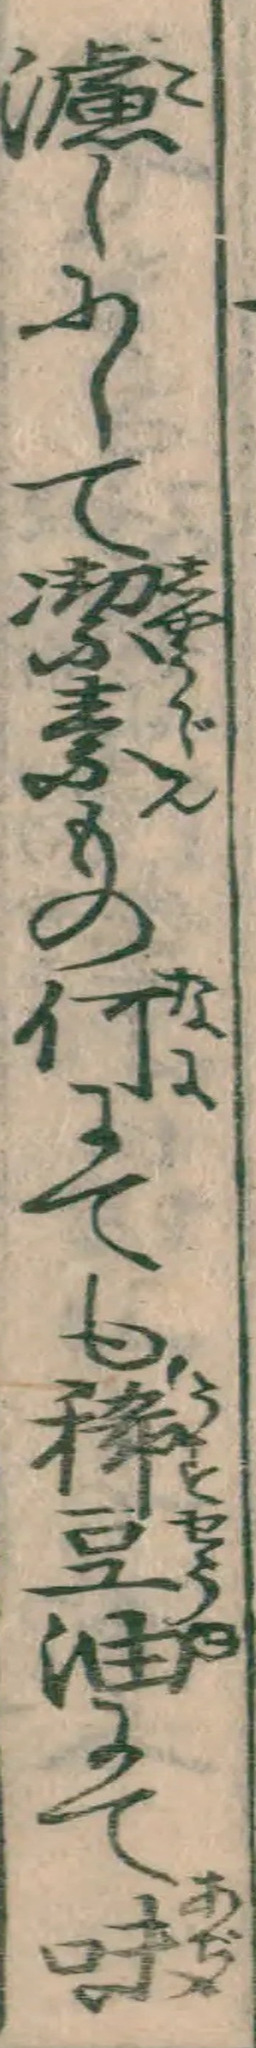濾しにして潔素もの何にても稀豆油にて味
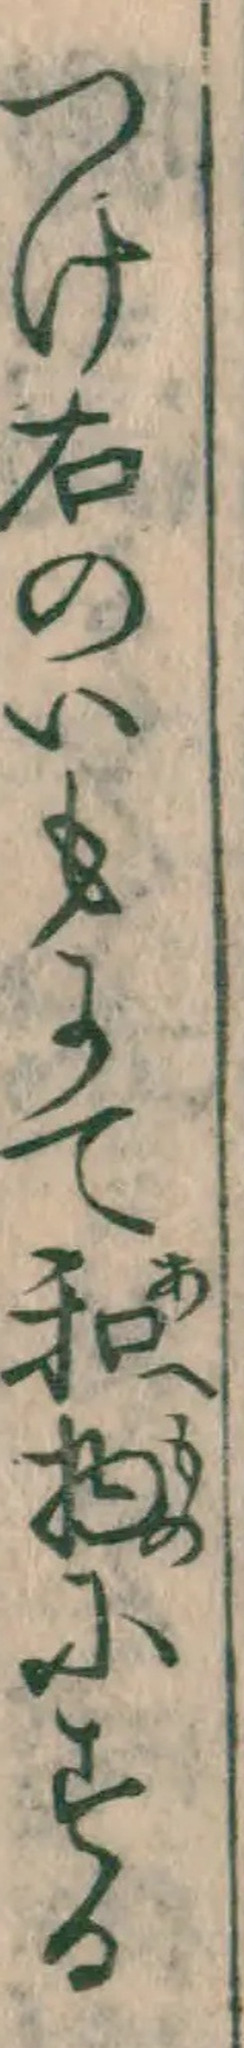つけ右のいもにて和物にする
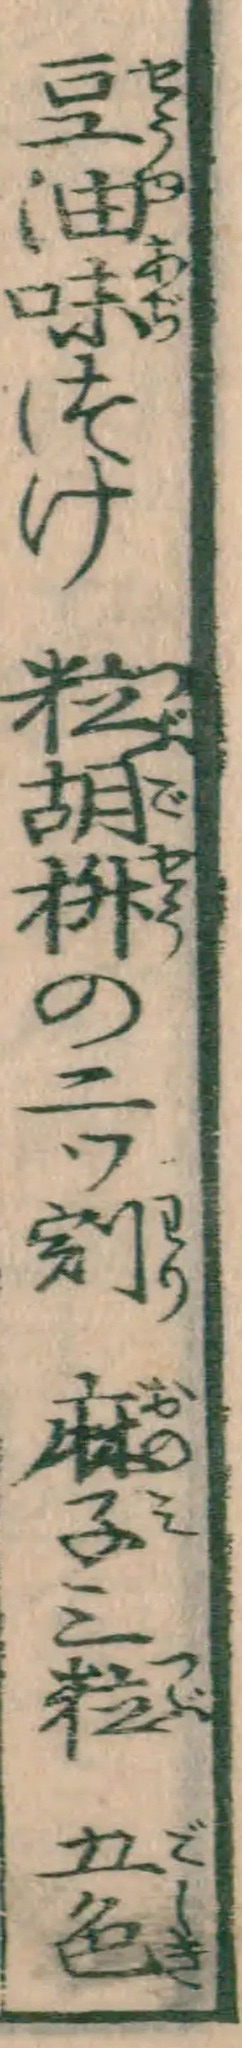豆油味つけ粒胡枡の二ツ割麻子三粒五色
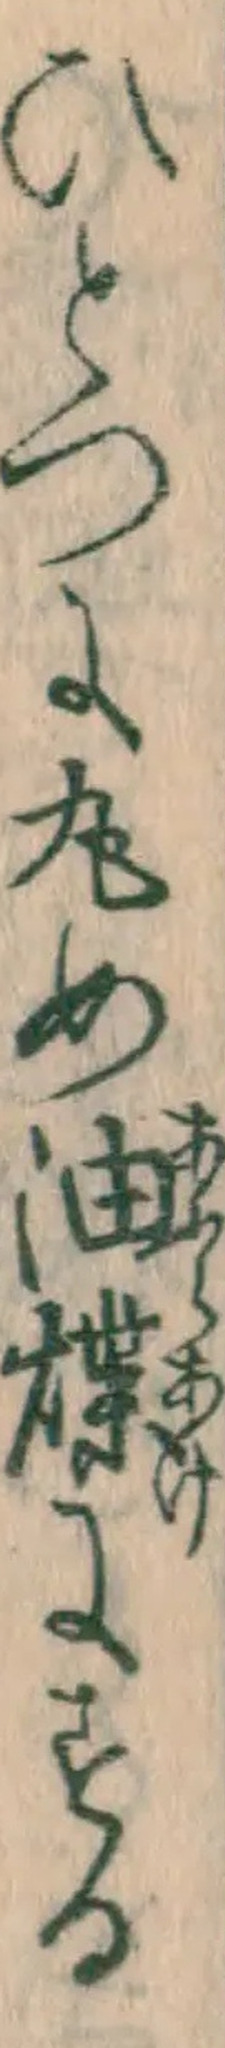ひとつに丸め油煠にする
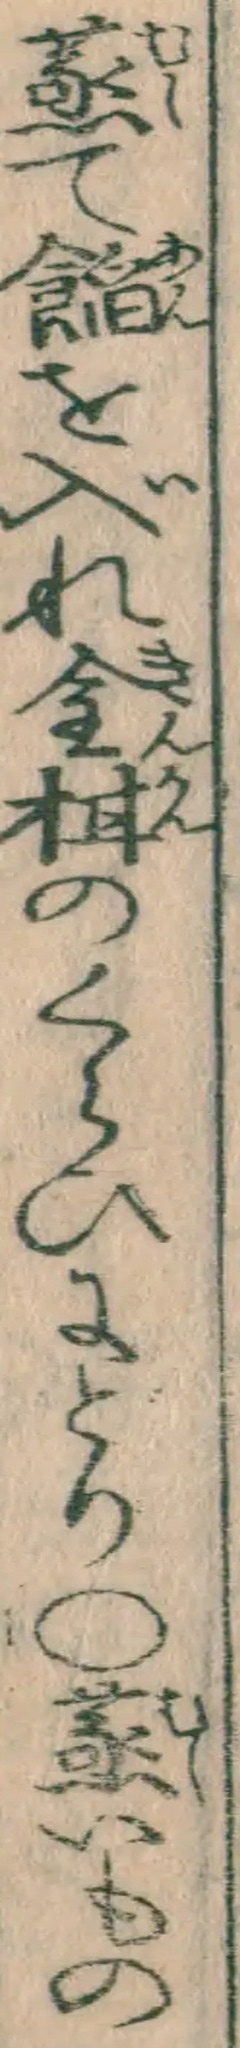蒸て餡を入れ金柑のくらひにとり○蒸いもの
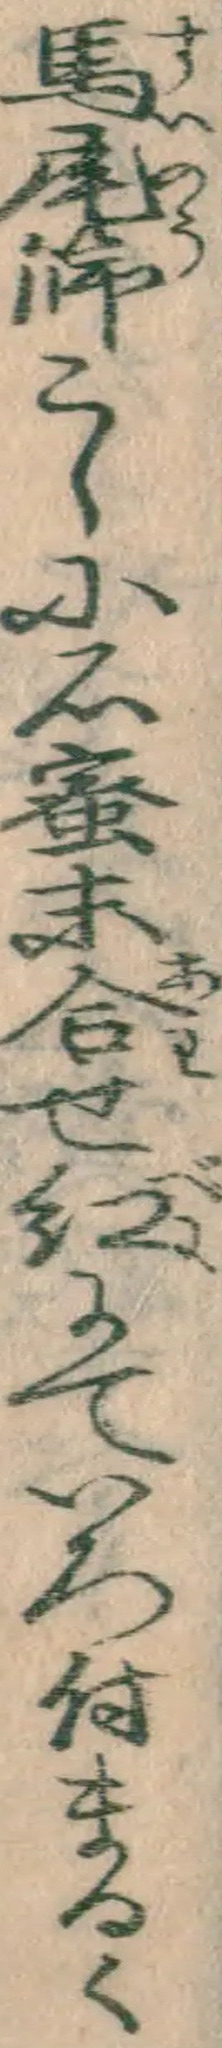馬尾篩こしに石蜜末合せ紅にていろ付まるく
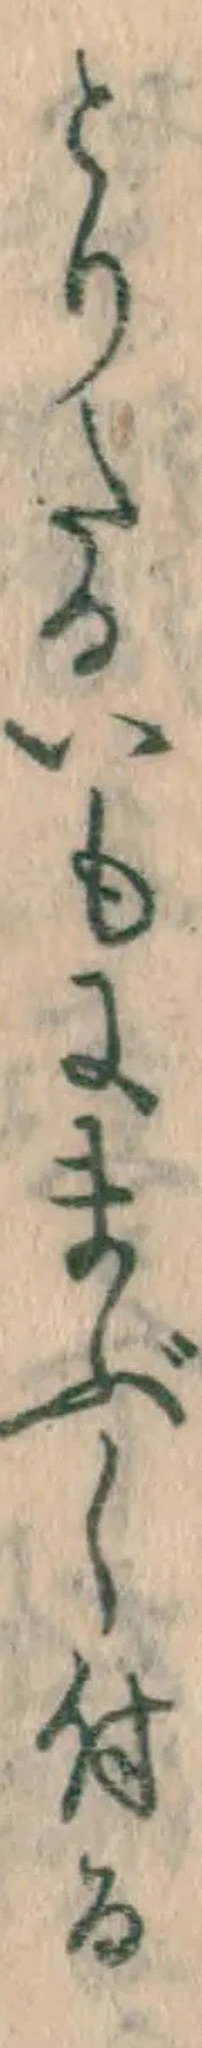とりたるいもにまぶし付る
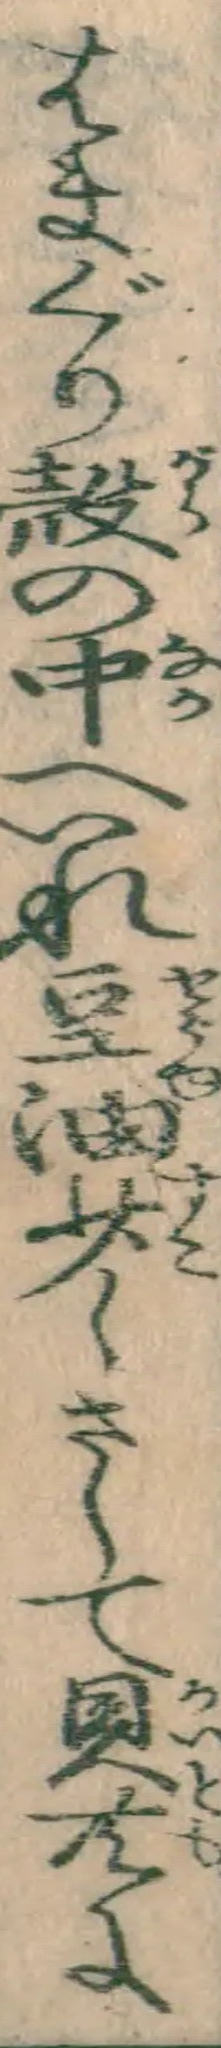はまぐり殻の中へいれ豆油少しさして貝共に

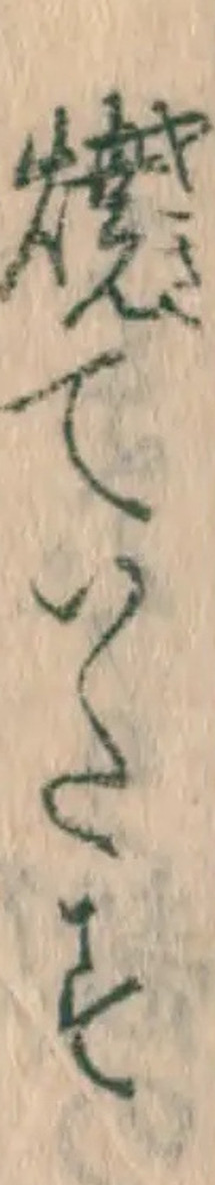焼ていたす
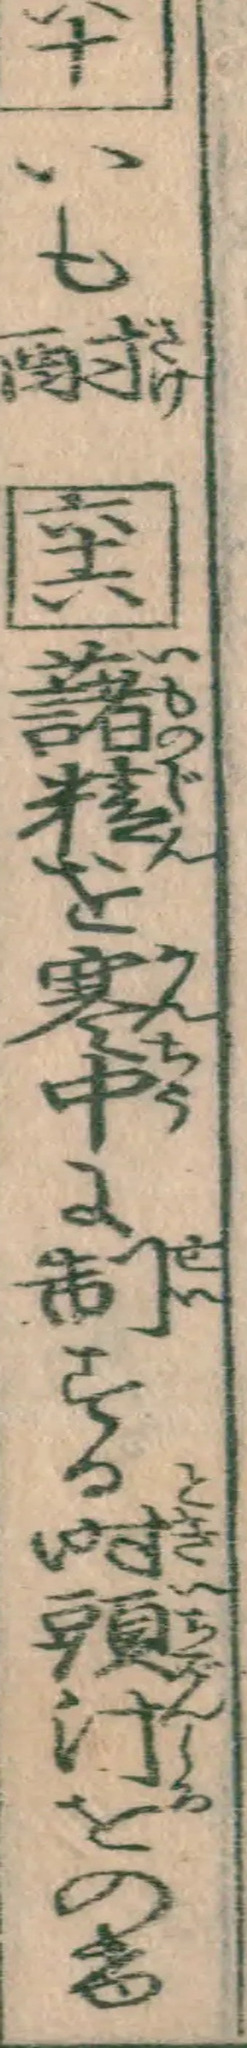[六十]いも酎[六十六]藷精を寒中に制する時頭汁をのけ
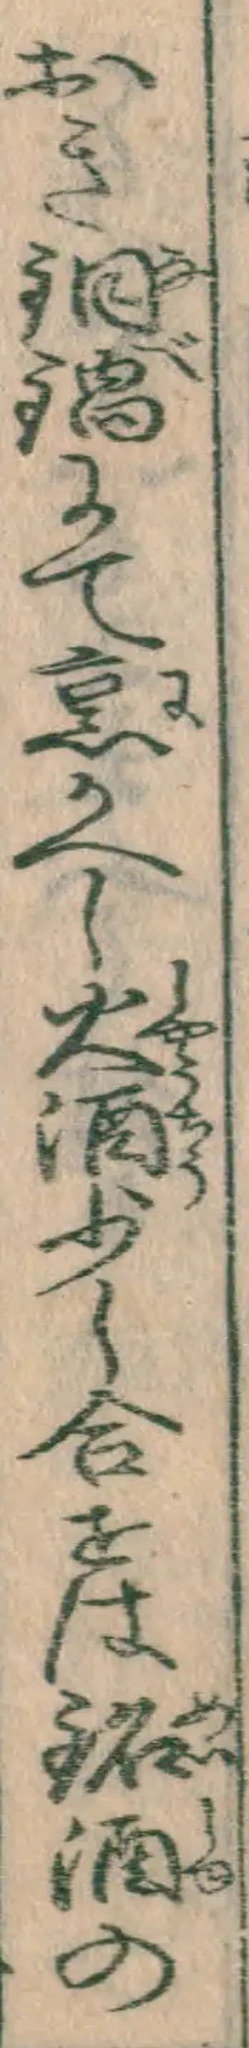おき銅鍋にて烹かへし火酒少し合せは銘酒の
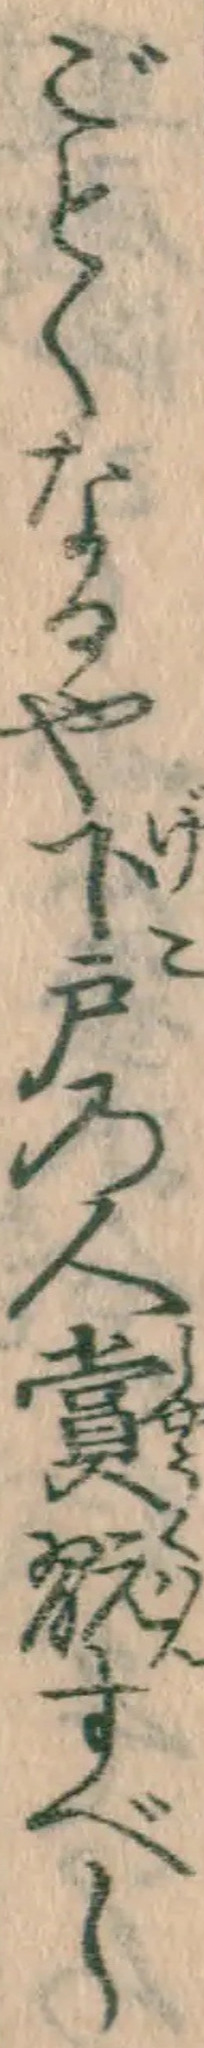ごとくなる也下戸の人賞翫すべし
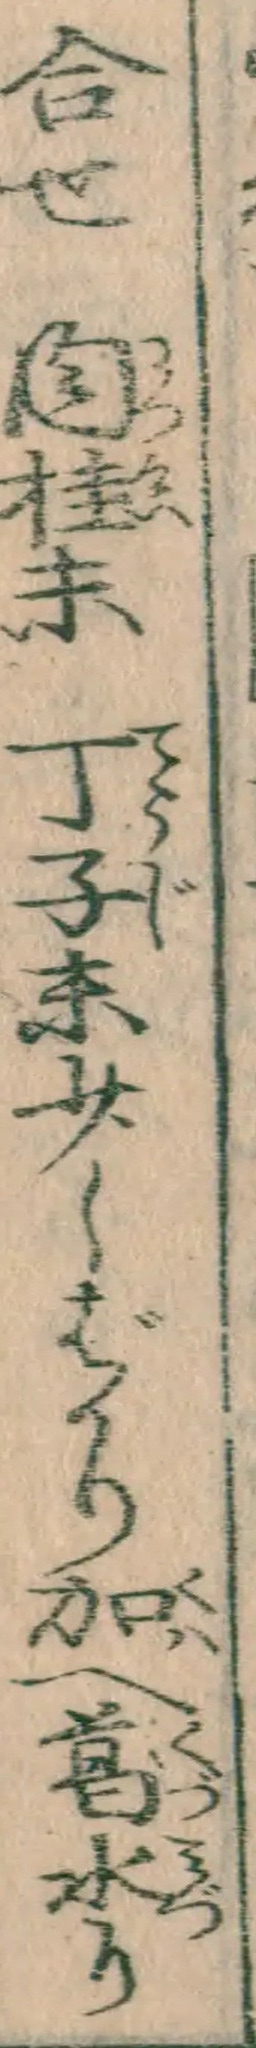合せ肉桂末丁子末少しばかり加へ葛水に
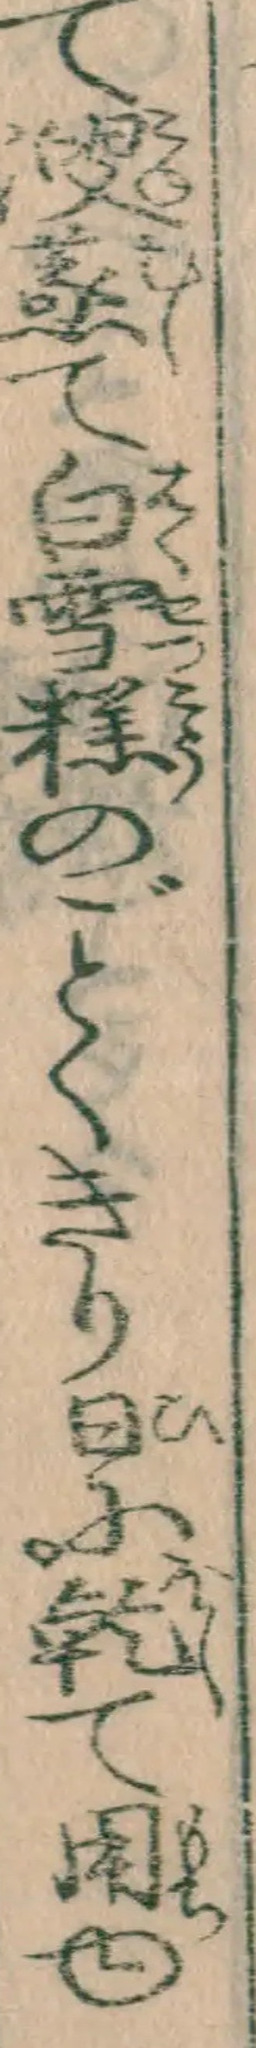て溲蒸て白雪糕のごとくきり日に乾て用ゆ
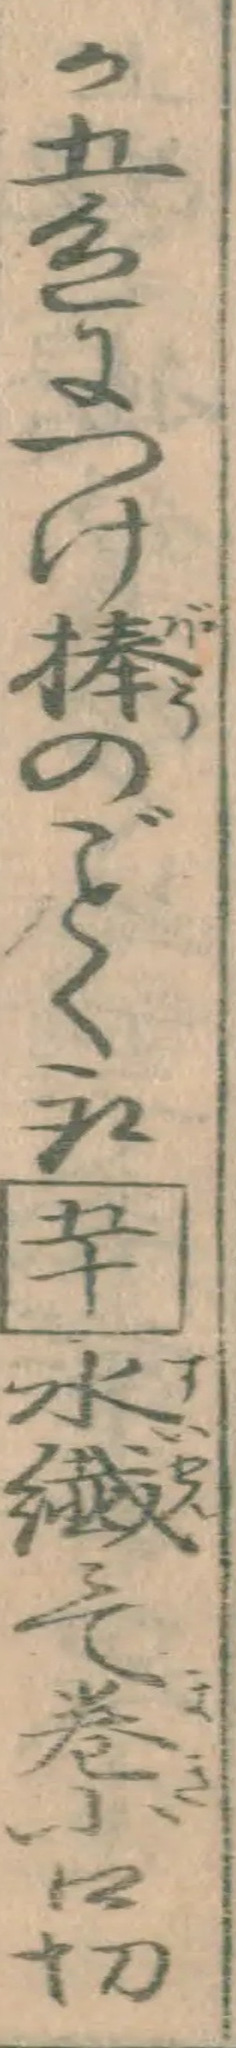か五色につけ棒のごとく取[五十]水繊にて巻小口切
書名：甘藷百珍
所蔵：国立国会図書館 National Diet Library, JAPAN
